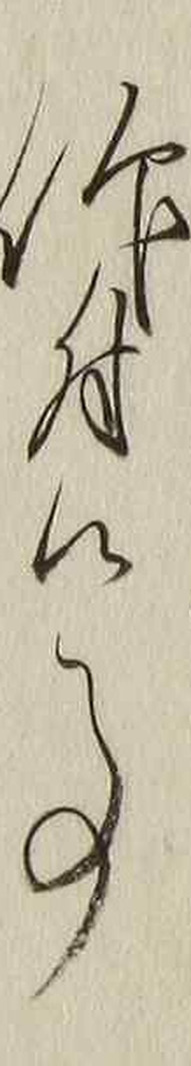仰付候事
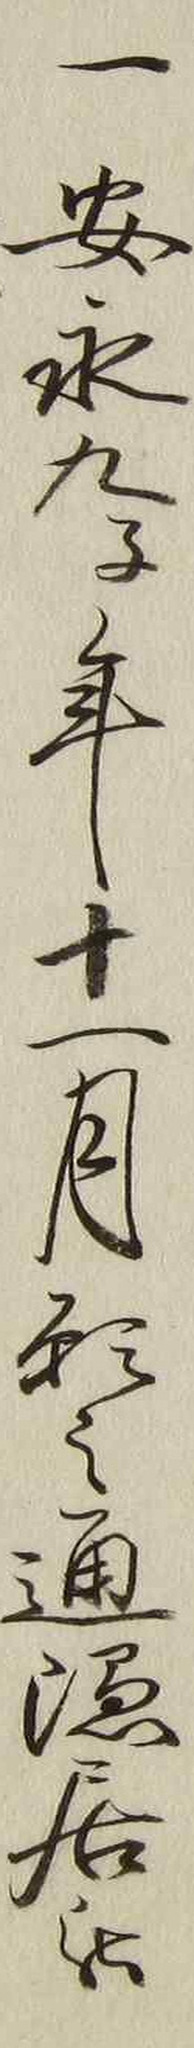一安永九子年十一月願之通隠居被
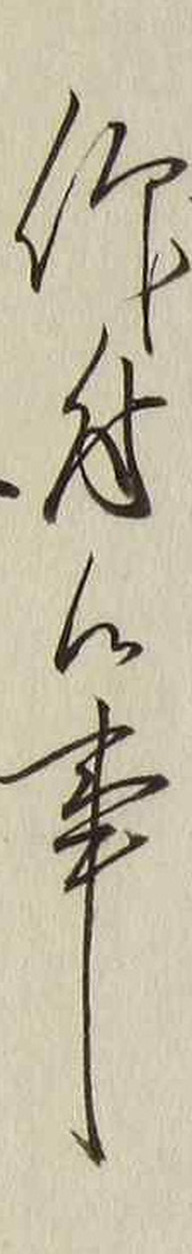仰付候事
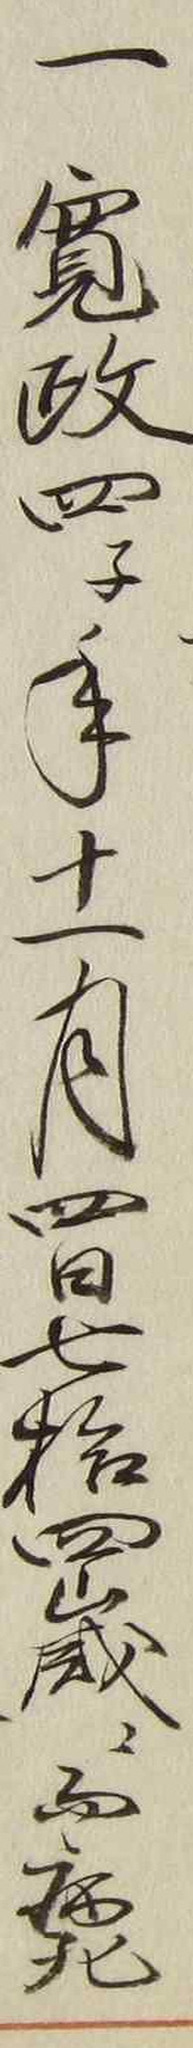一寛政四子年十一月四日七拾四歳ニ而病死
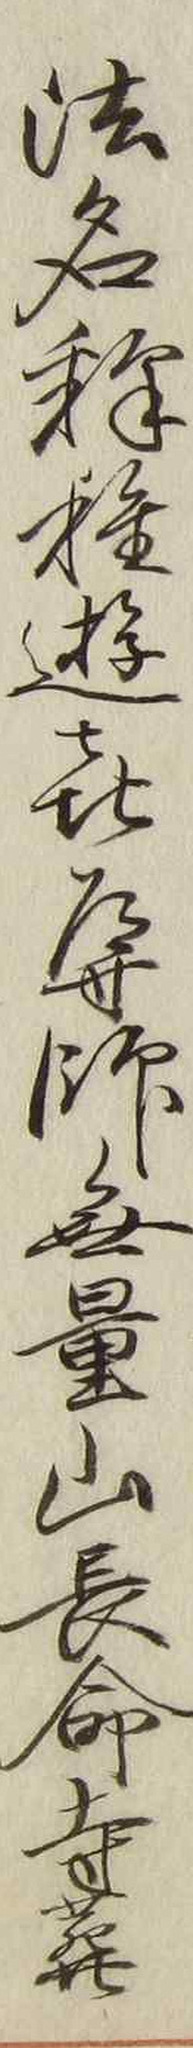法名釈種遊喜導師無量山長命寺葬

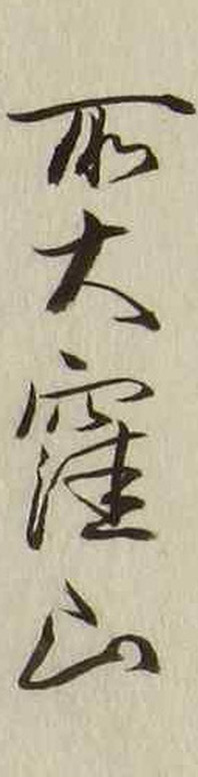所大窪山
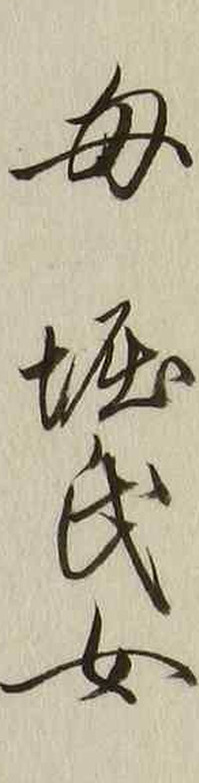母堀氏女
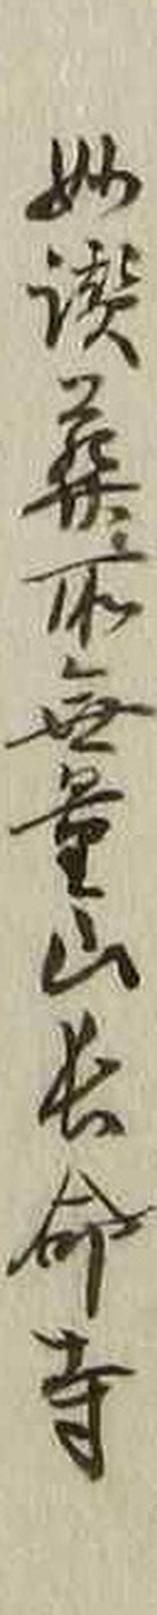妙讃葬所無量山長命寺
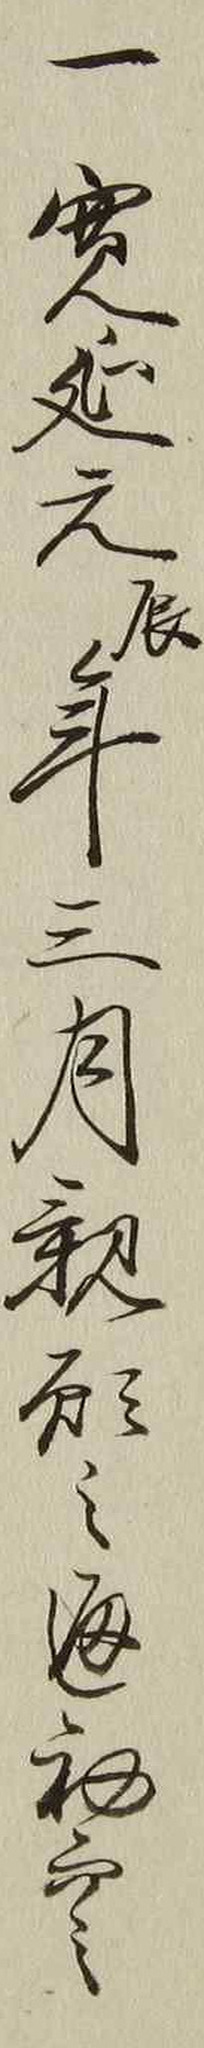一寛延元年辰年三月親願之通初而之
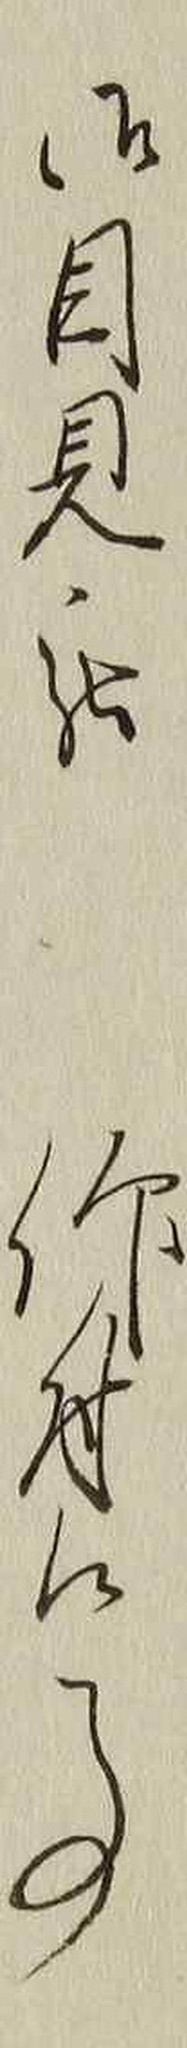御目見被仰付候事
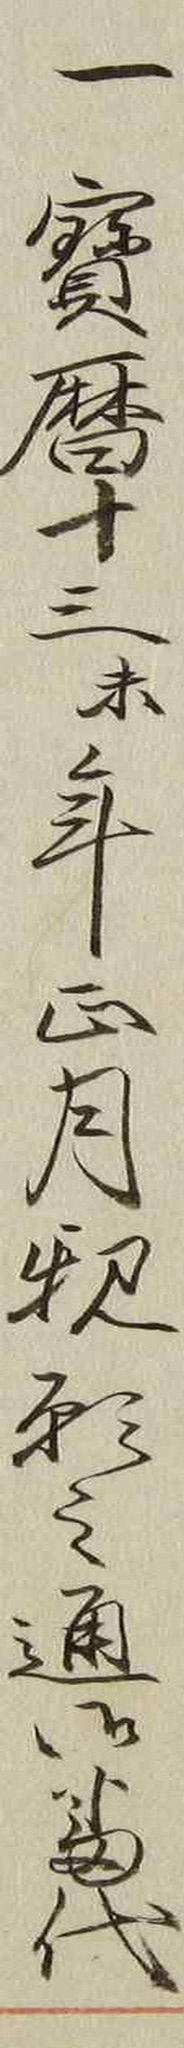一宝暦十三未年正月親願之通御番代
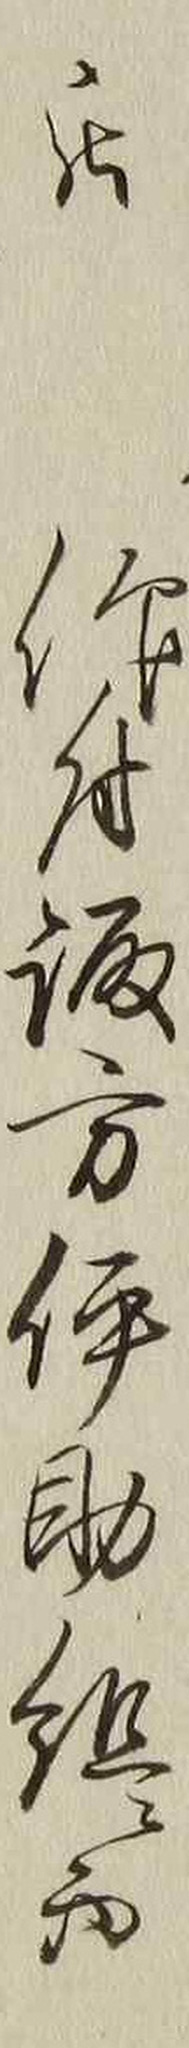被仰付諏方伊助組ニ而
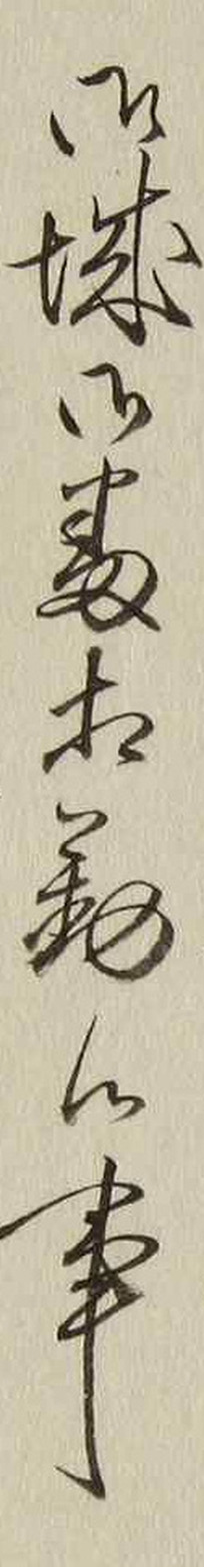御城御番相勤候事
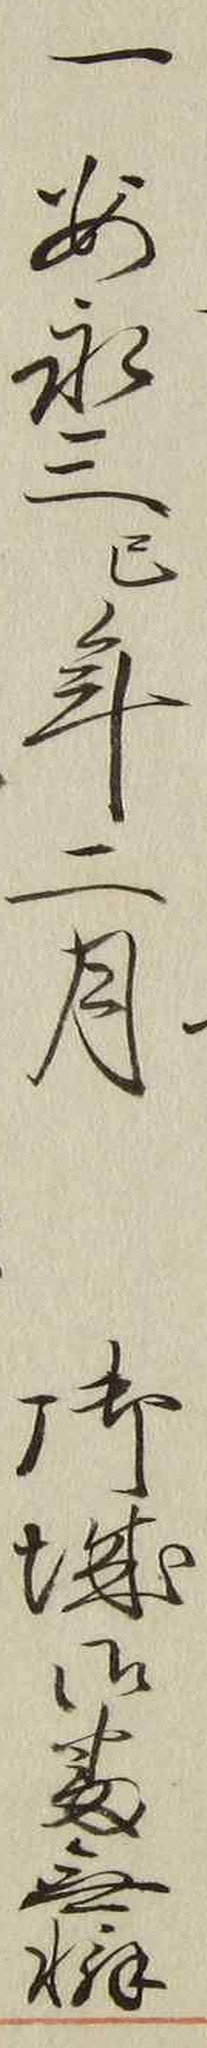一安永三巳年二月御城御番無懈
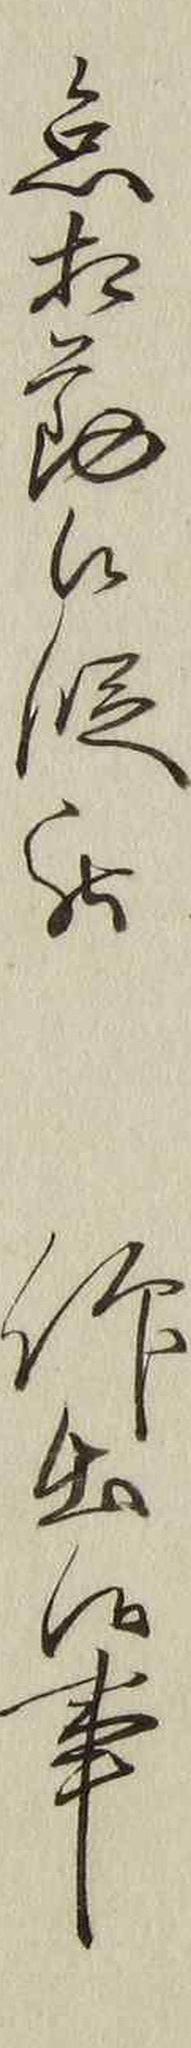怠相勤候段被仰出候事
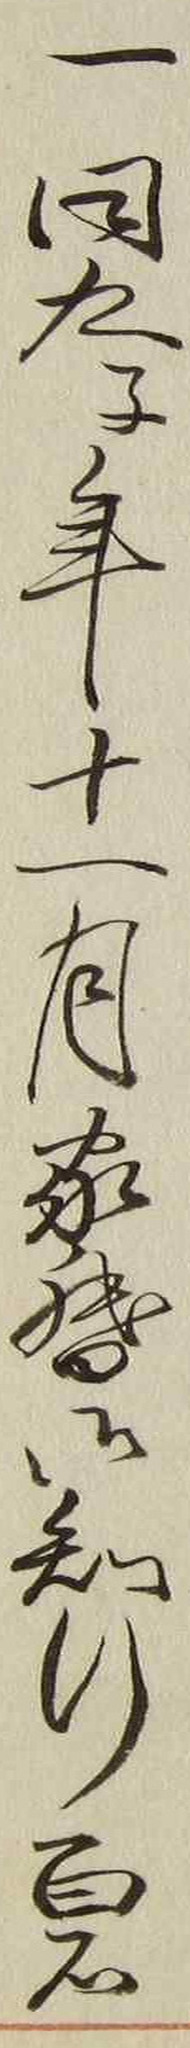一同九子年十一月家督御知行百石
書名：諸士系譜　巻之54　ほ之部1
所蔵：会津若松市立会津図書館
